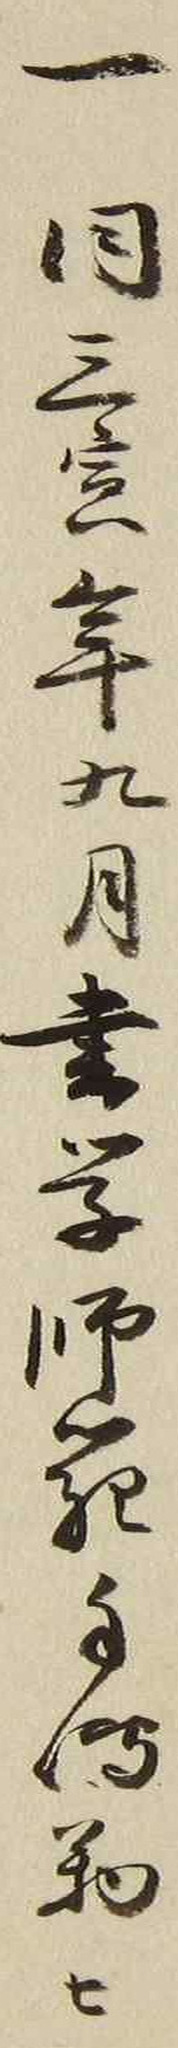一同三寅年九月書学師範手伝勤被
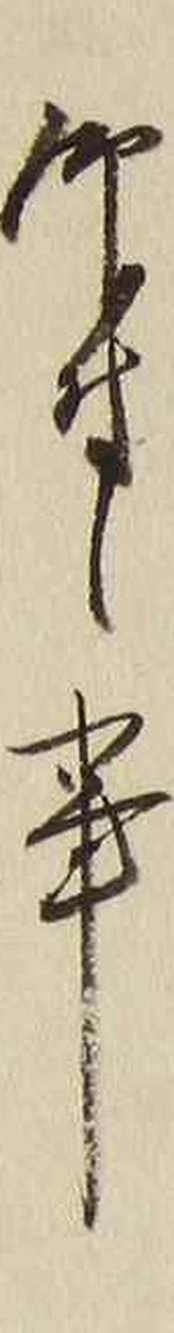仰付候事
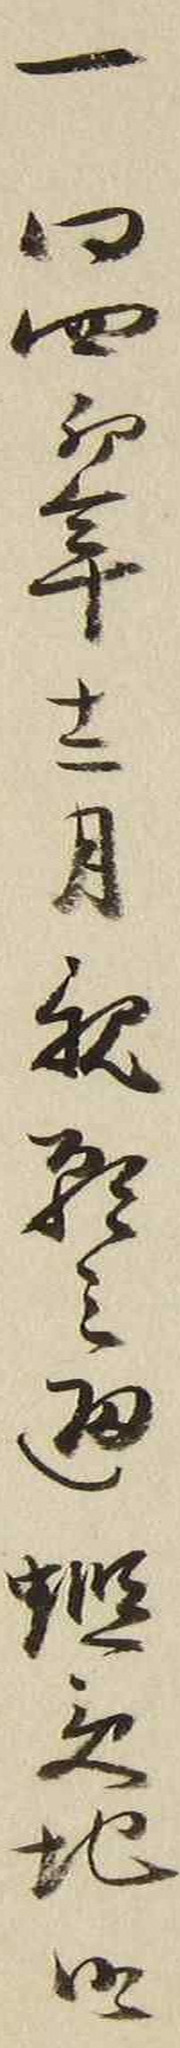一同四卯年十二月親願之通蝦夷地御
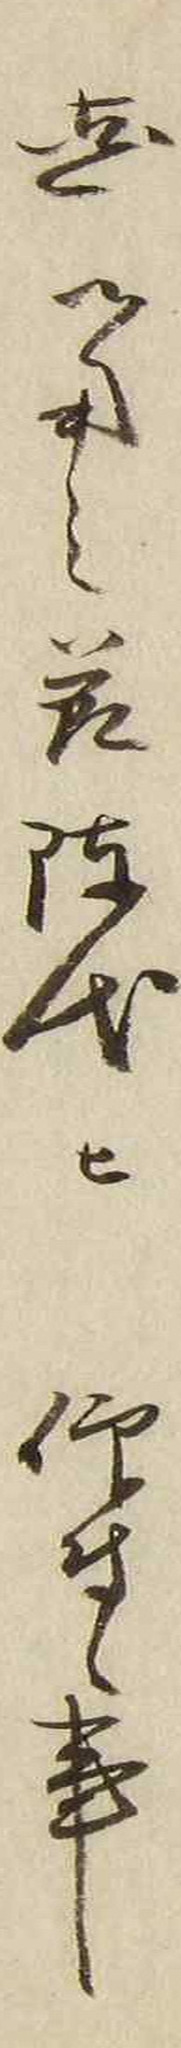固御用之節陣代被仰付候事

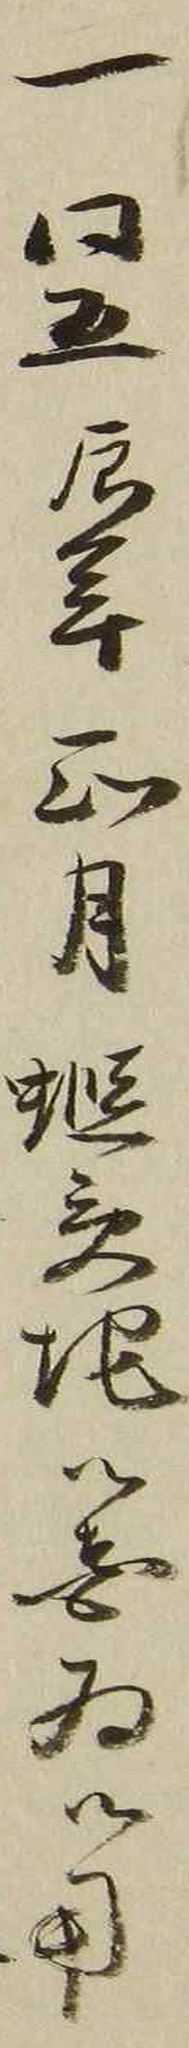一同五辰年正月蝦夷地御固為御用
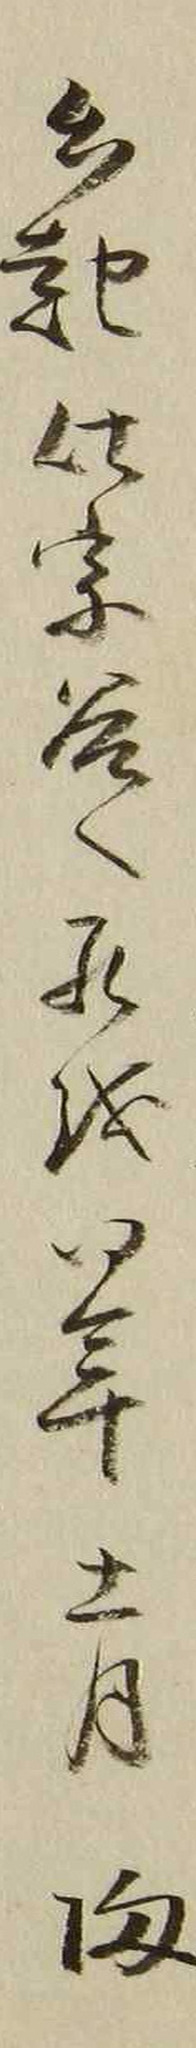出起仕宗谷へ罷越同年十一月帰
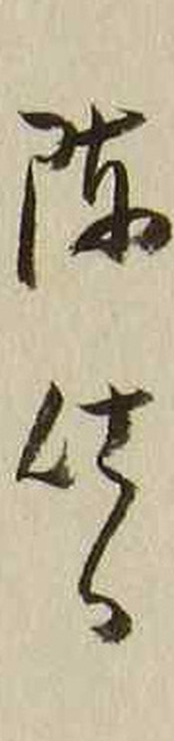陣仕候
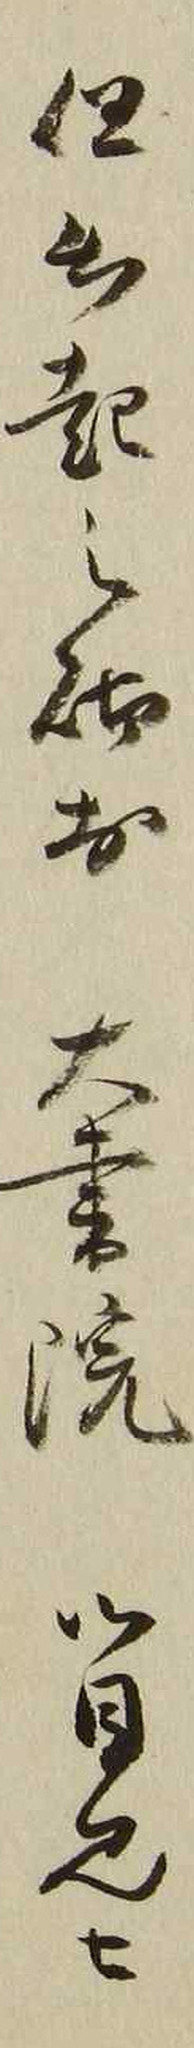但出起之砌於大書院御目見被
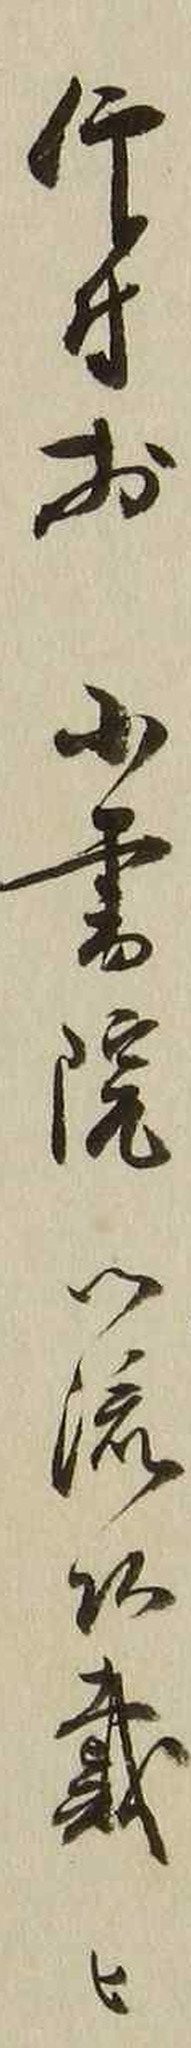仰付於小書院御流頂戴被
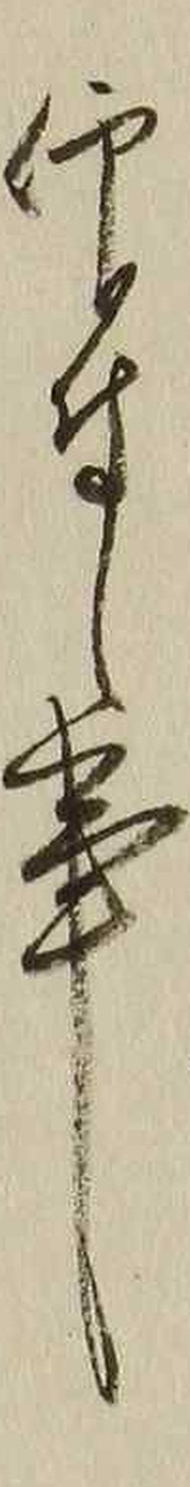仰付候事
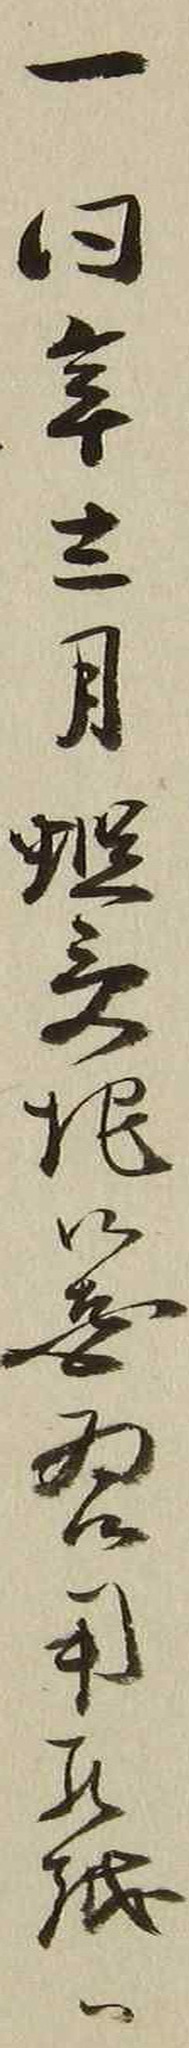一同年十二月蝦夷地御固為御用罷越候
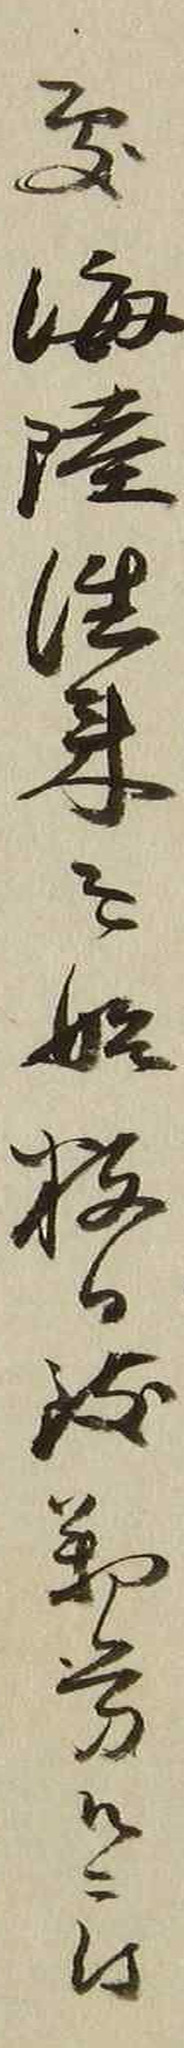処海陸往来を始数日致勤労候ニ付
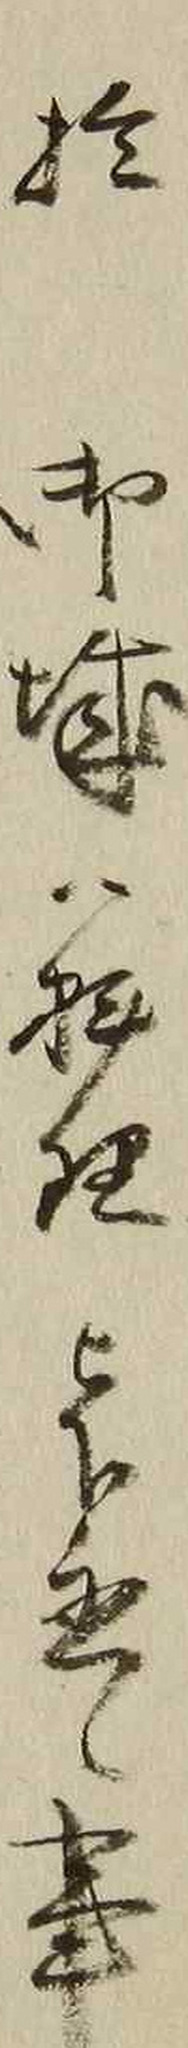於御城御料理被下置候事
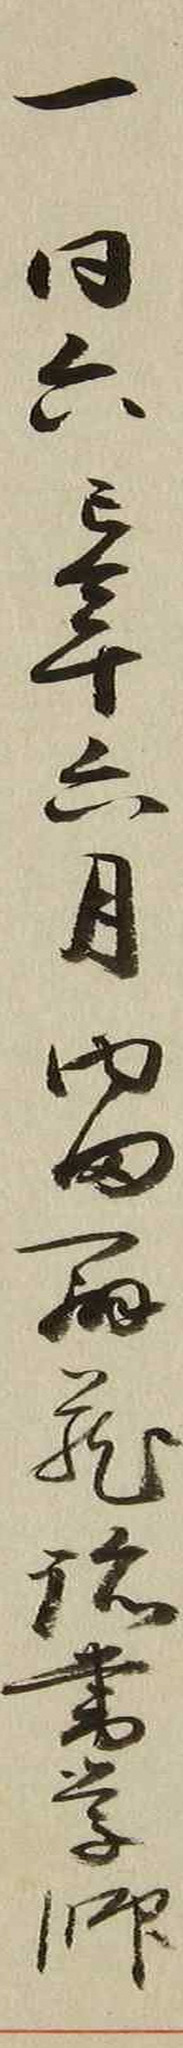一同六巳年六月内田弁蔵跡書学師
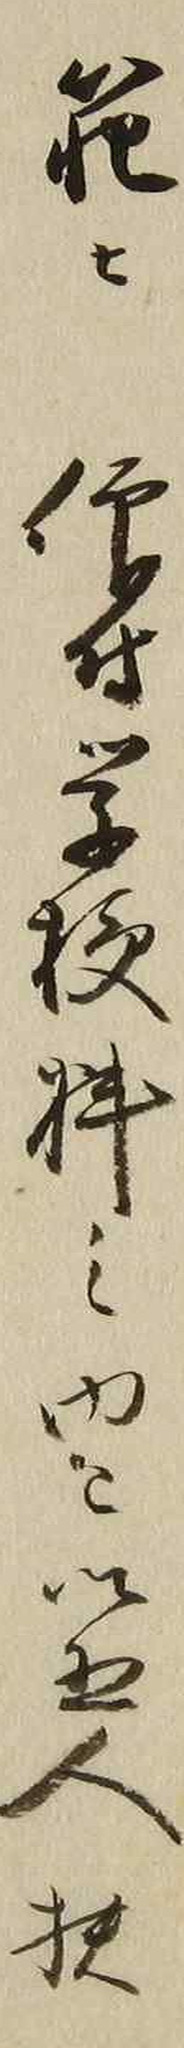範被仰付学校料之内を以五人扶
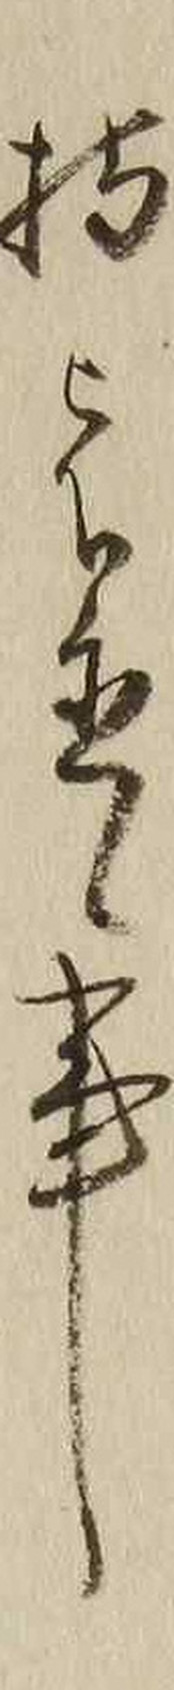持被下置候事
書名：諸士系譜　巻之288　さ之部20
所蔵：会津若松市立会津図書館
